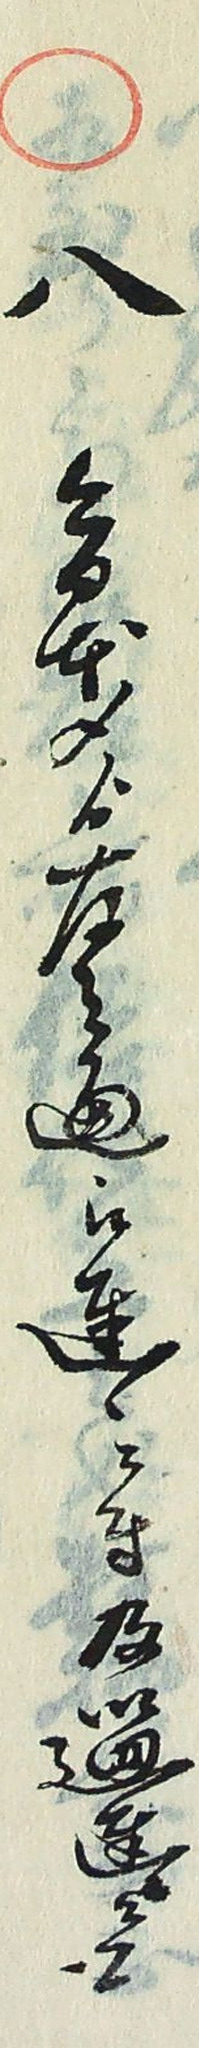○八今日本〆ゟ左之通被達候ニ付及御廻達ニ候以上
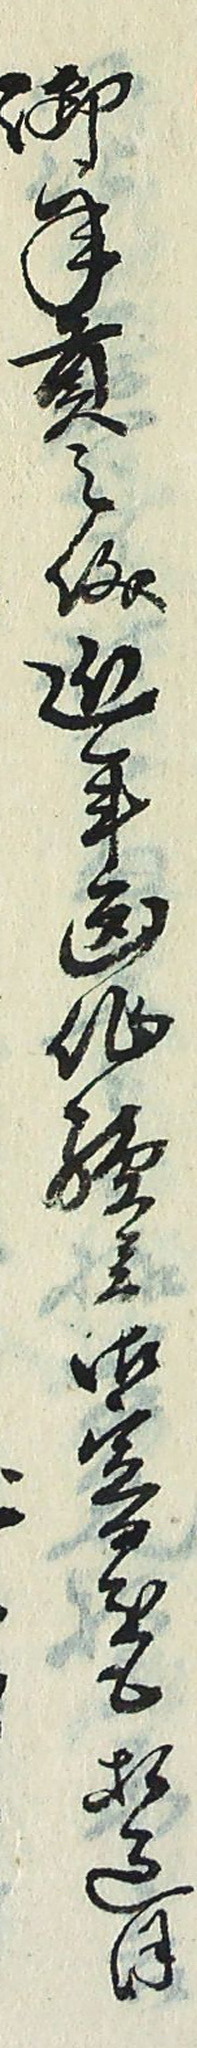御年貢之儀近年凶作続ニ而御定日をも打過月
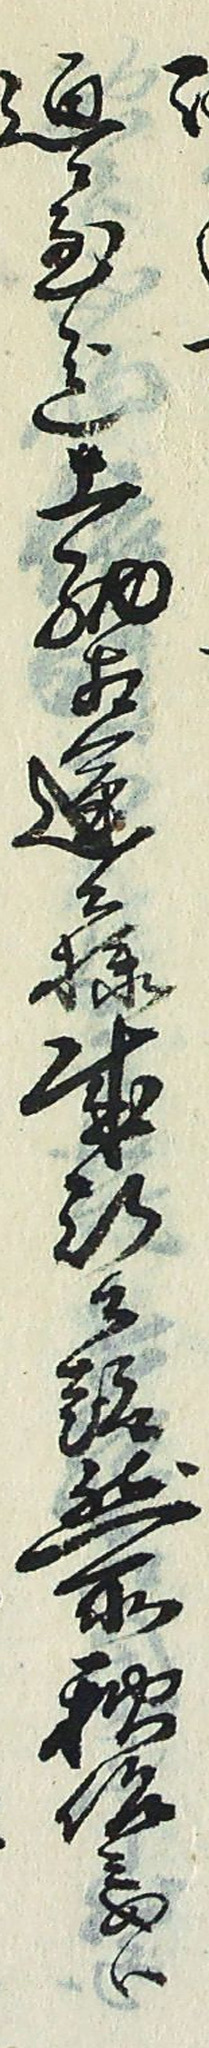迫ニ至迄上納相運候様成行候趣然所秋作之義ハ
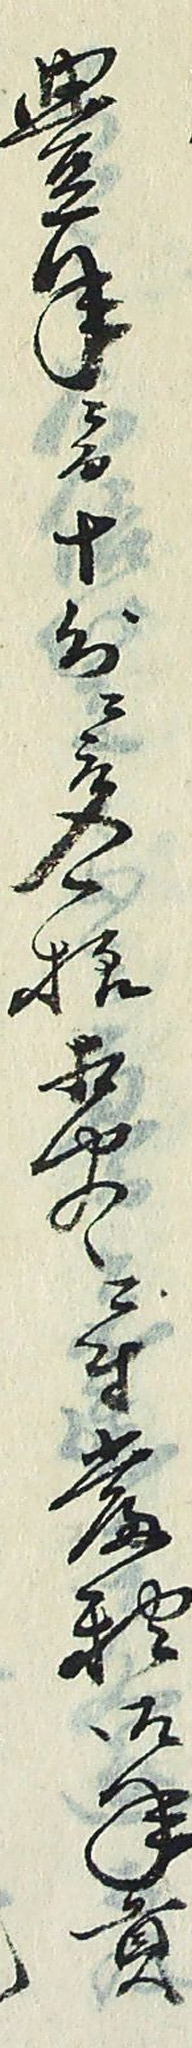豊年ニ而十分ニ取入候様相聞候ニ付當秋御年貢
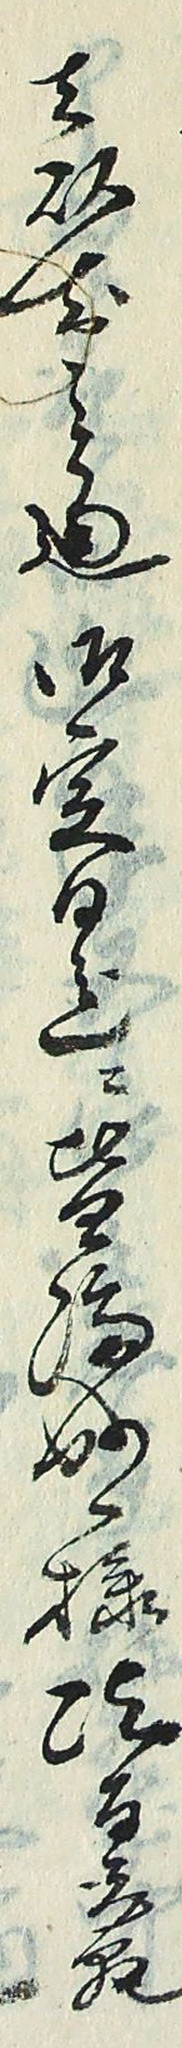者以前之通御定日迄ニ皆済成候様屹と取究
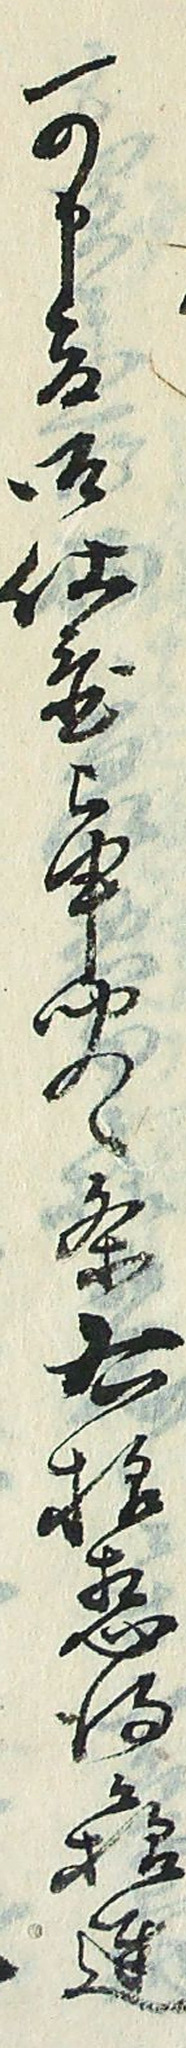可申旨御仕置被申聞候条右様相心得候様達
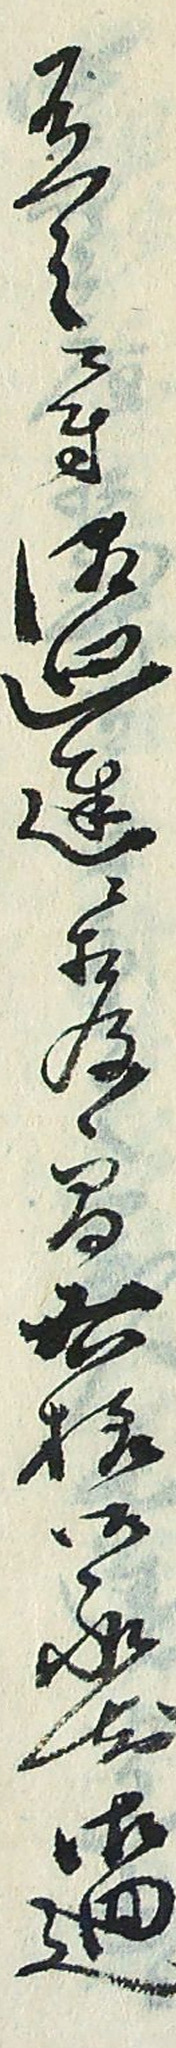有之ニ付御廻達ニ相及候間右様御承知御廻

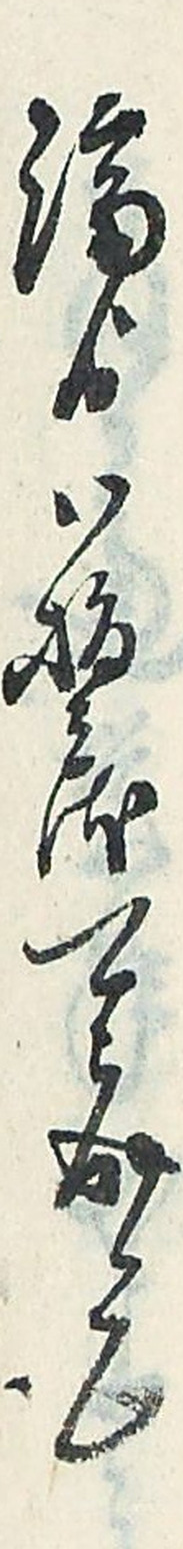済ゟ御指戻可被成候以上
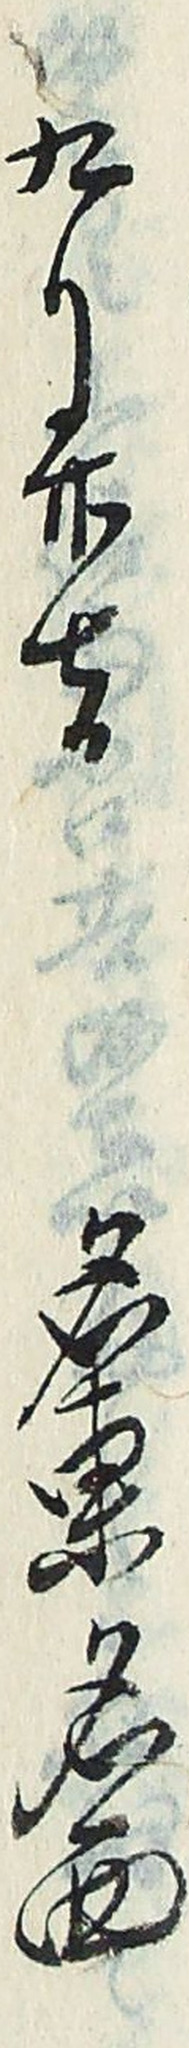九月廿七日名東名西
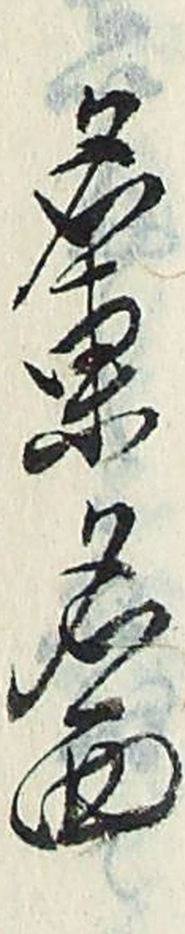名東名西
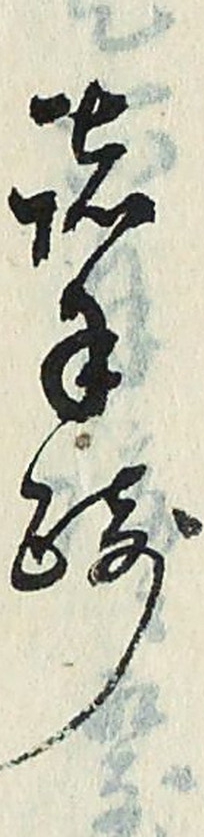諸手崎
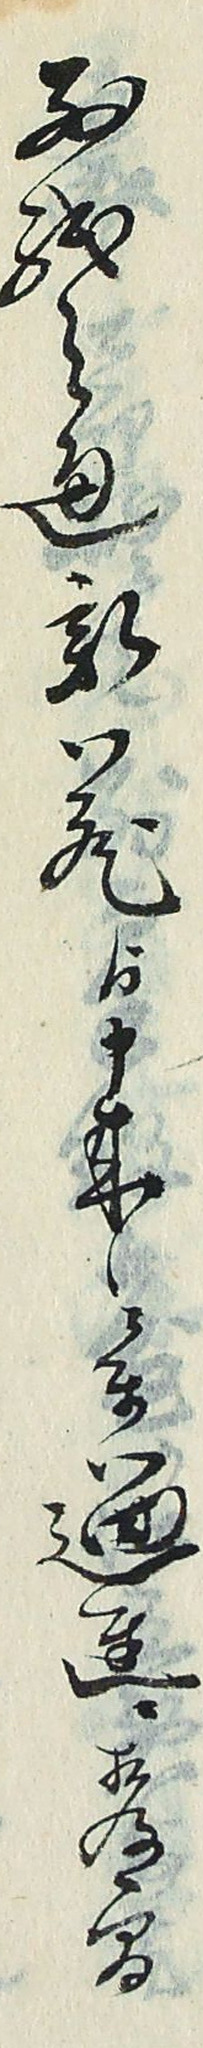別紙之通新御蔵ゟ申来候ニ付御廻達ニ相及候間
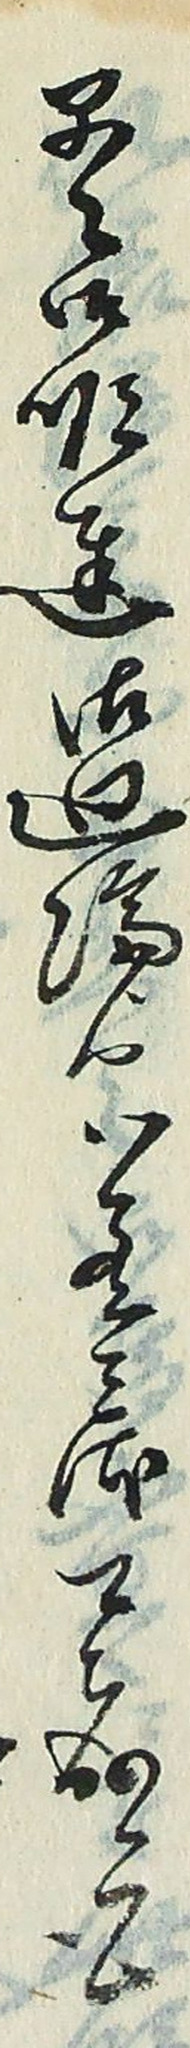早々御順達御廻済ゟ御差戻可被成候以上
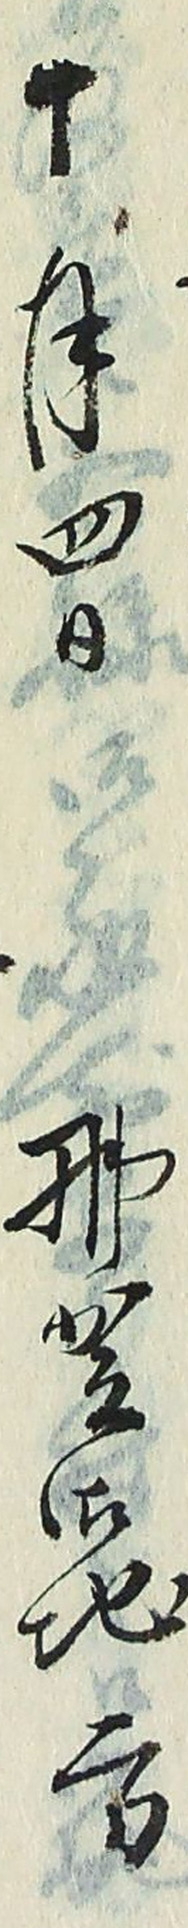十月四日那賀御地方
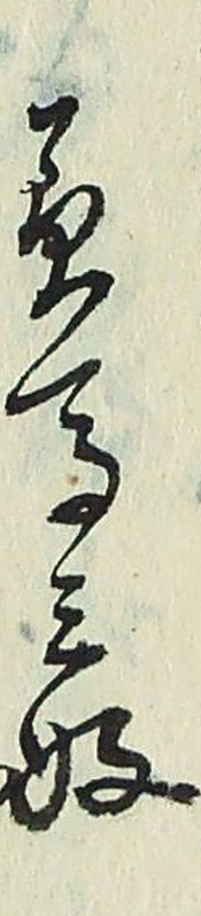美馬三好
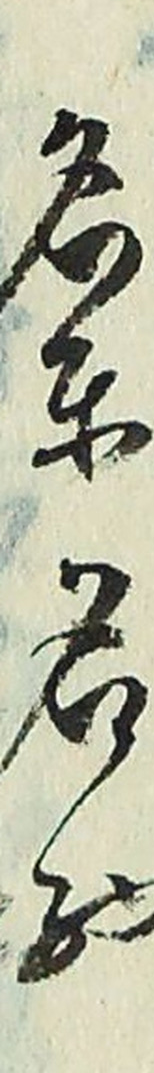名東名西
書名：諸御趣意書并御下知向之写
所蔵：鳴門教育大学 Naruto University of Education
